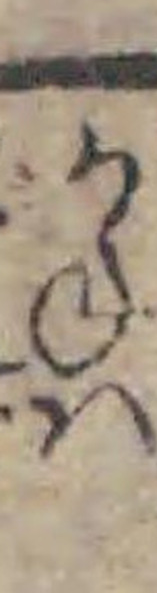かねは
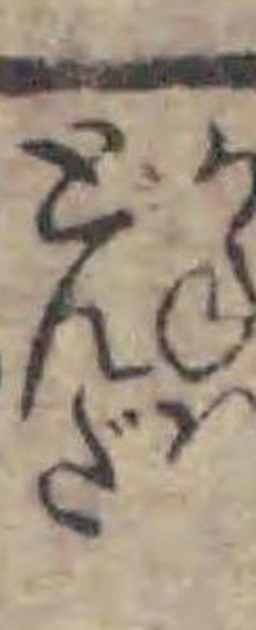とんだ
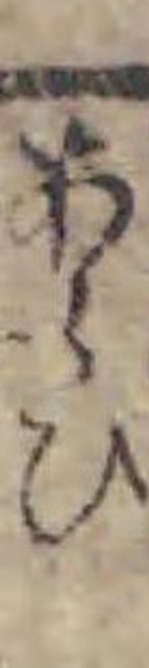あらひ
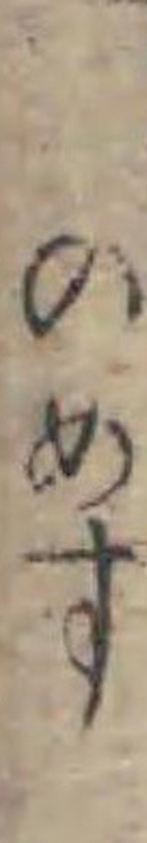のめす
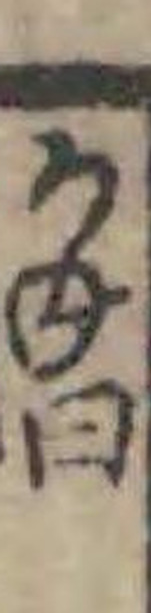かねを
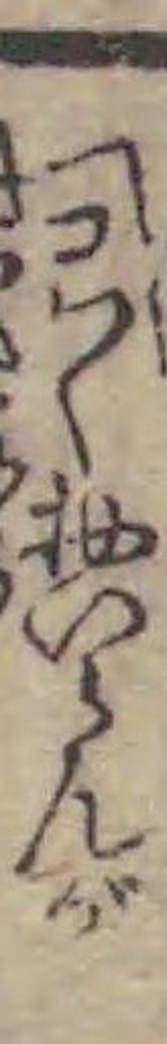〽コレ〳〵おいらんが
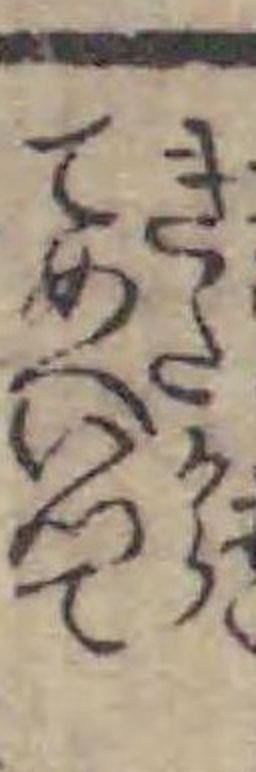てめへいつて
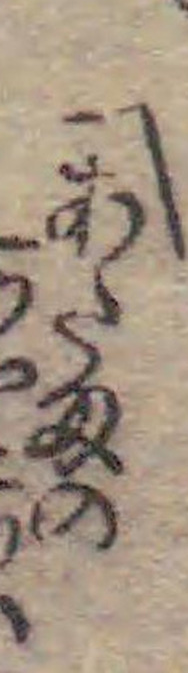〽あたまの
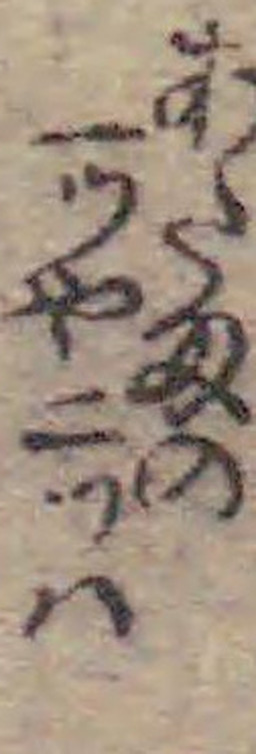一つや二つは
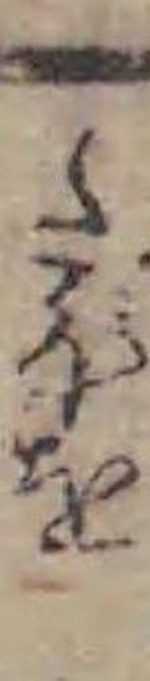たぼを
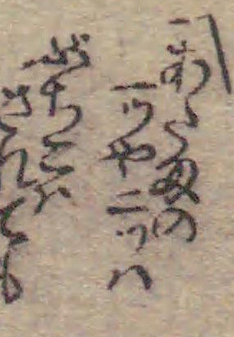一つや二つは
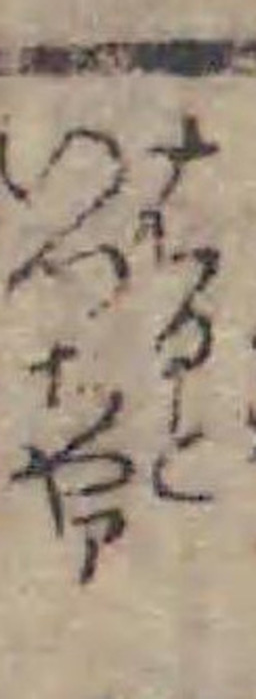いつちやァ
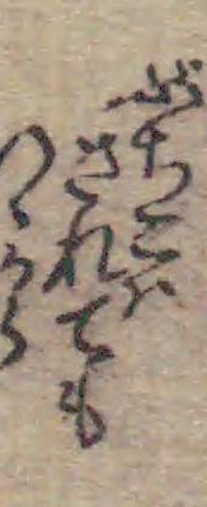されても
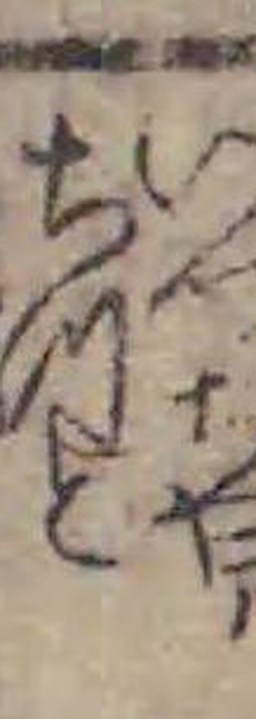ちつと
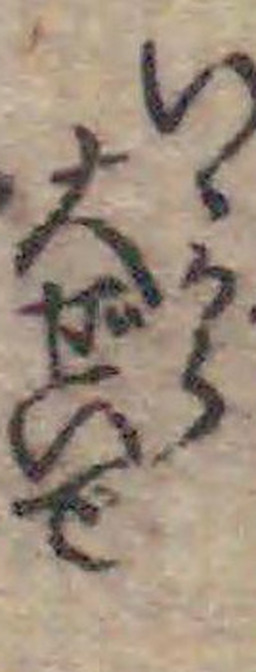大ぜいで
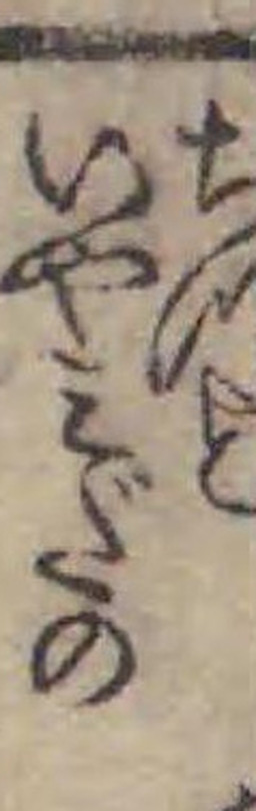いやみだの
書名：新鋳小判 : 3巻
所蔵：国立国会図書館 National Diet Library, JAPAN
